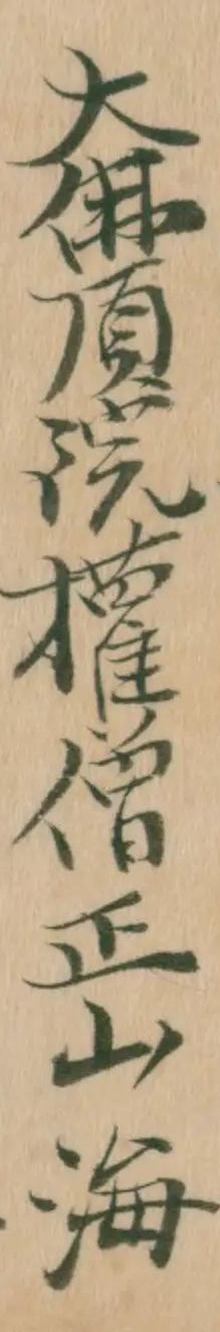大佛頂院権僧正山海
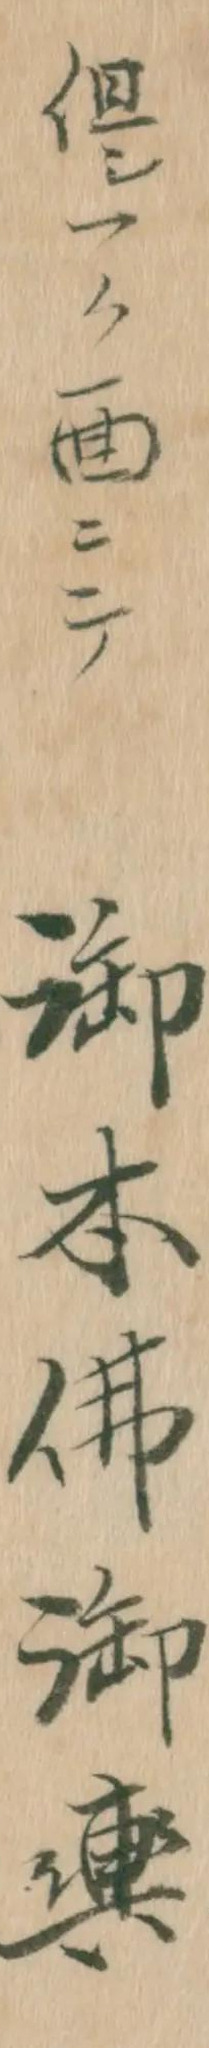但シフク面ニテ御本佛御輿
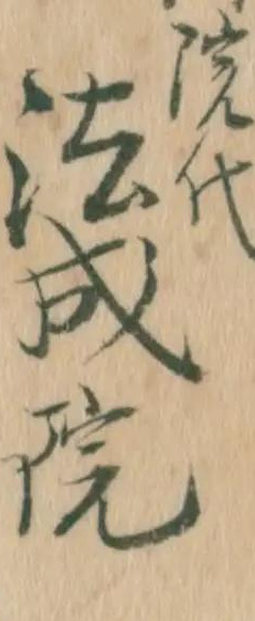法成院

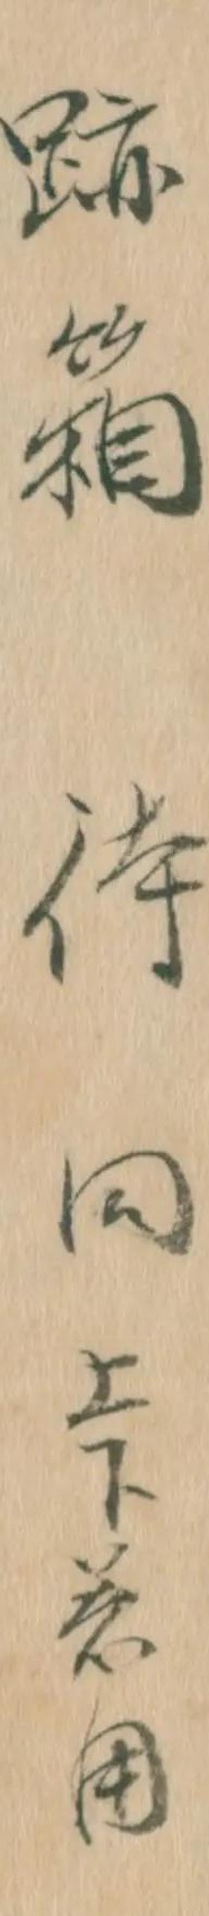跡箱侍同上下着用
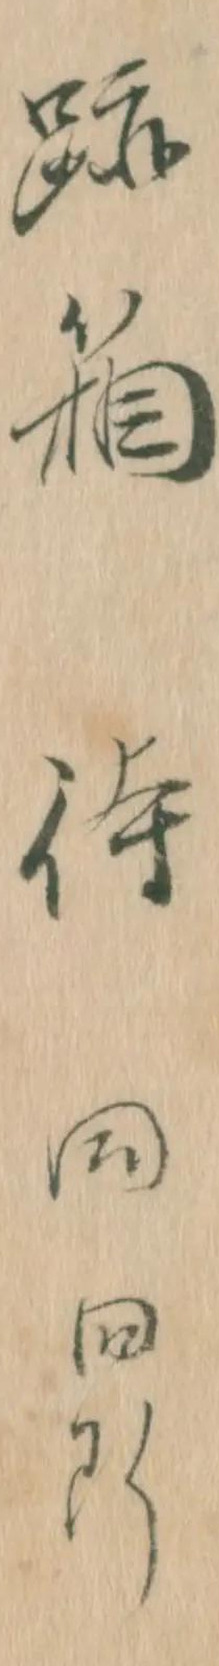跡箱侍同同断
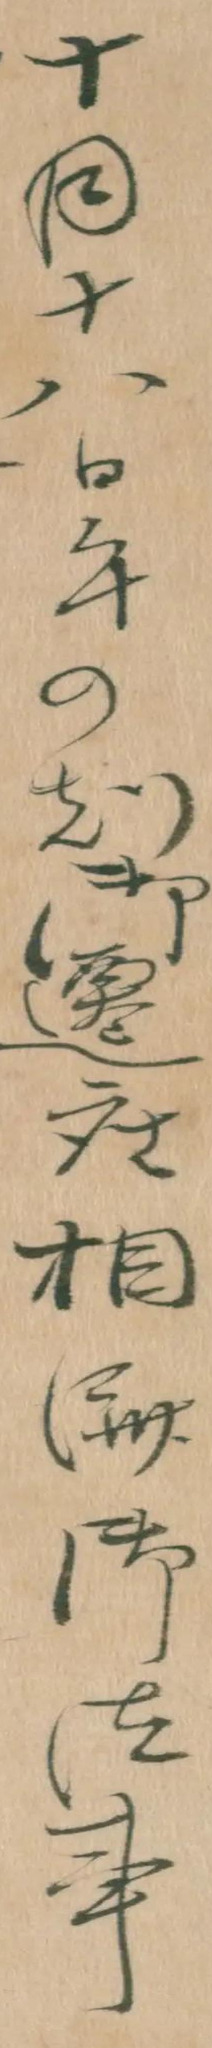十月十八日午の刻御遷座相済御法事
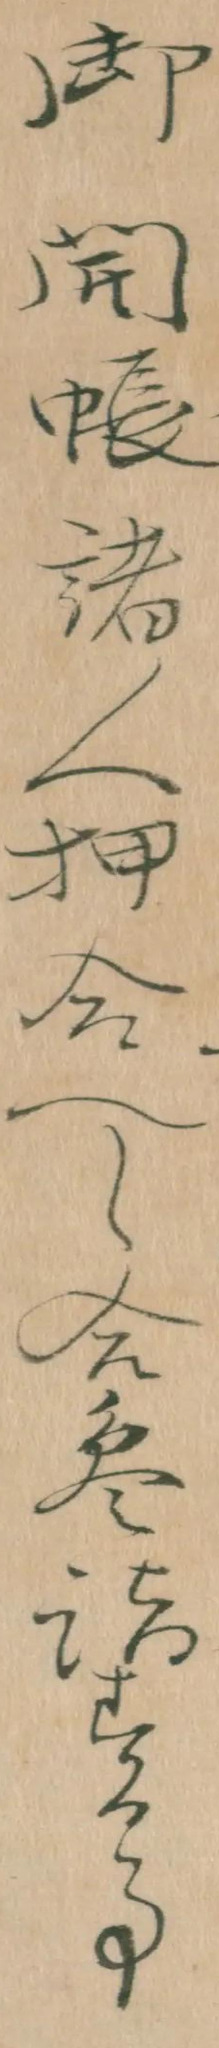御開帳諸人押合へし合参詣する事
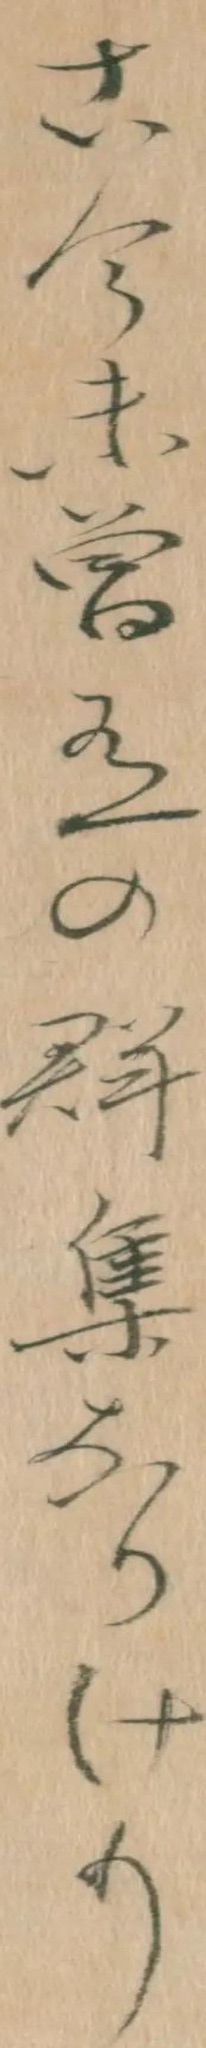古今未曾有の群集なりけり
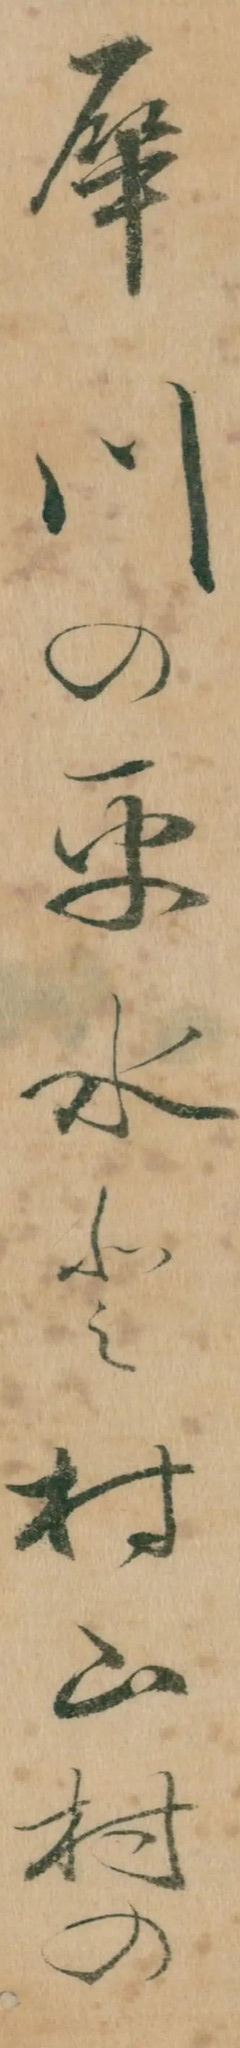犀川の平水と村山村の
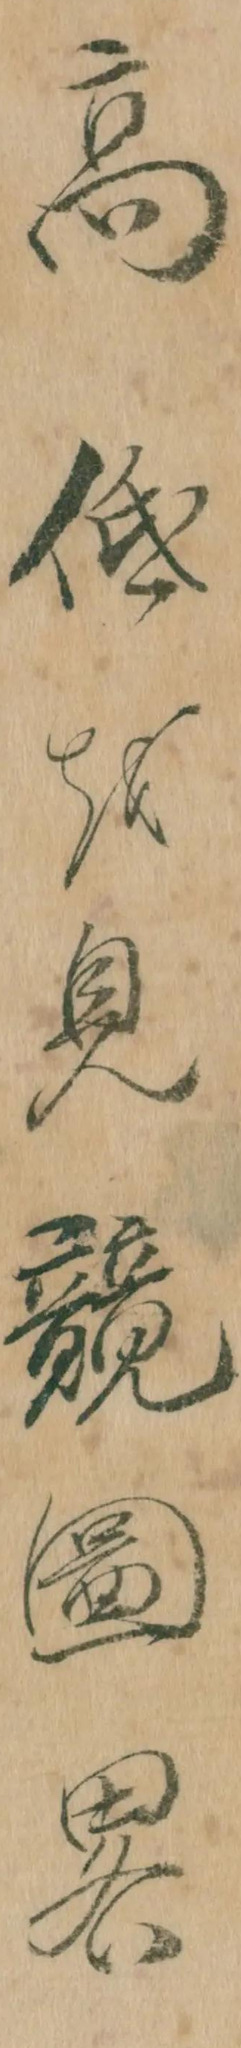高低を見競図略
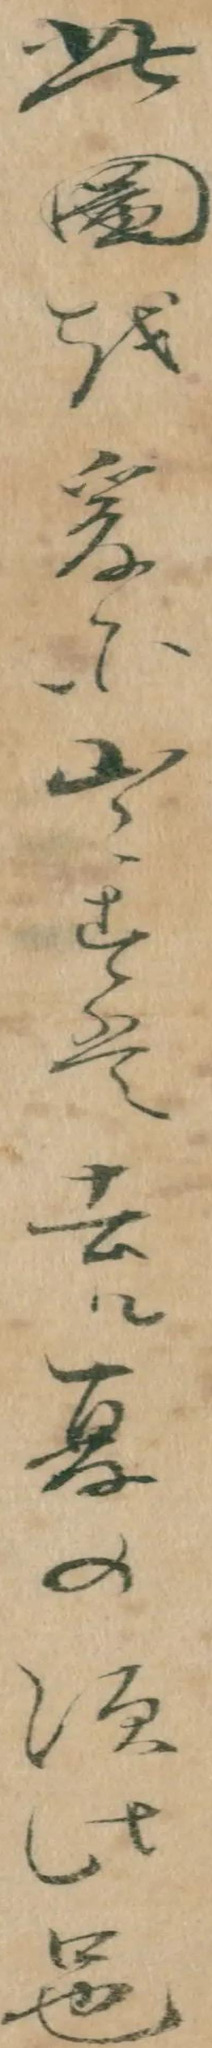此図を爰に出すは去ル夏の頃此邑
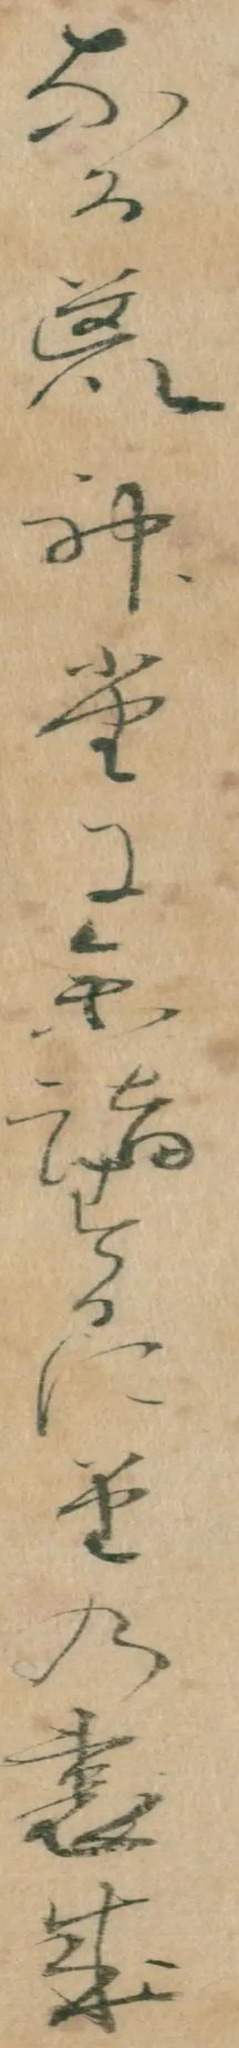なる荒神堂に参詣するに堂の裏成
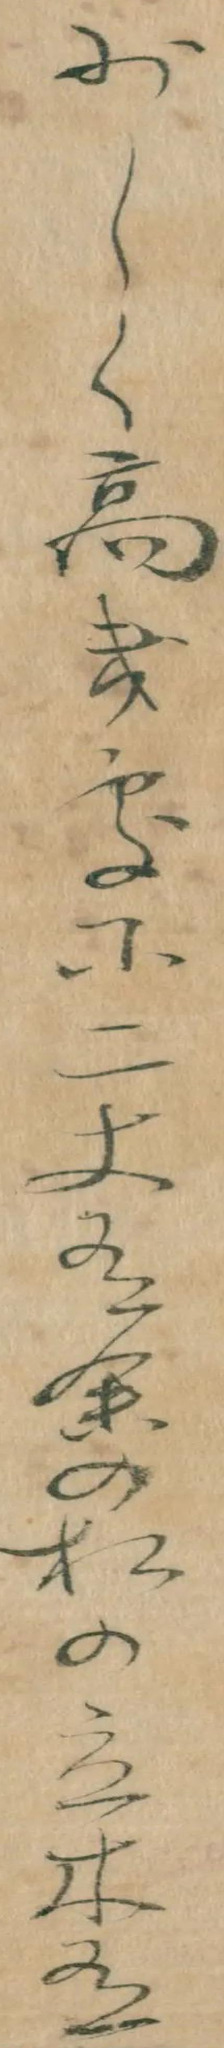少しく高き處に二丈有余の松の立木有
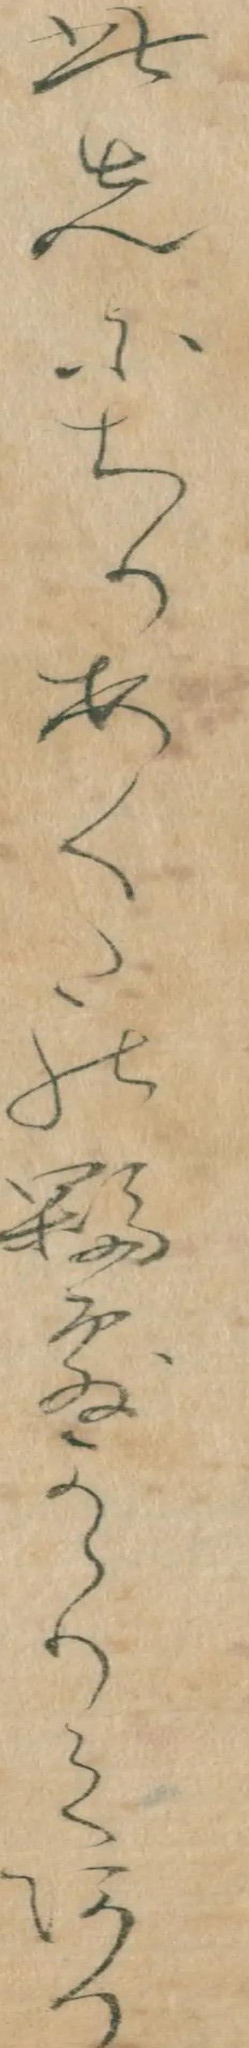此先にちりあくたの夥敷かゝりてあり
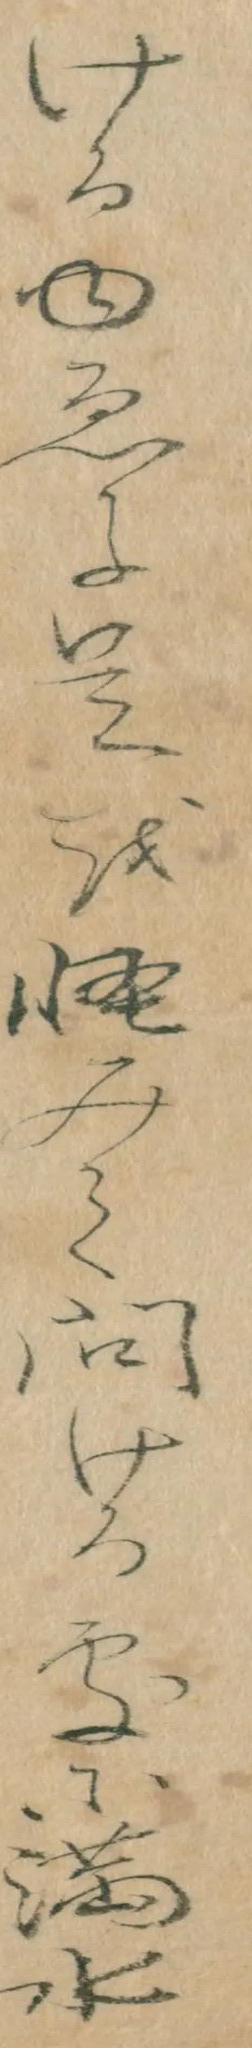けるゆゑに是を怪みて問ける處に満水
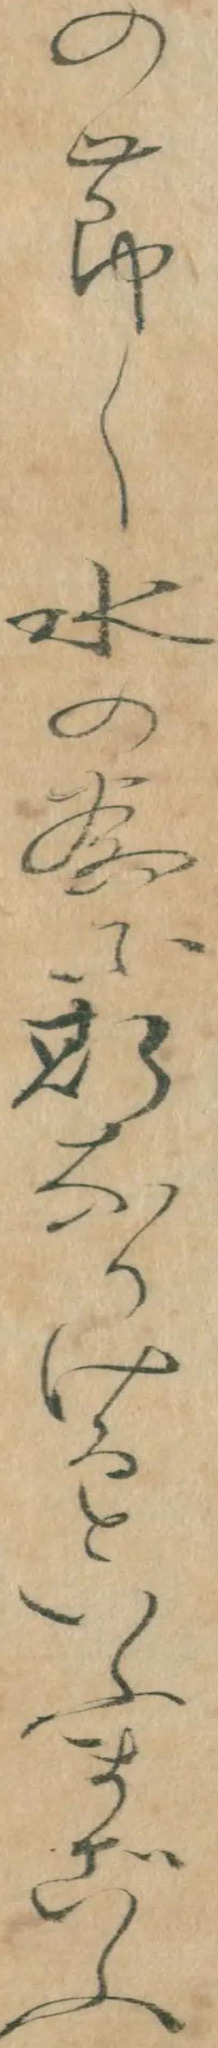の節し水の番に斯なりけるといふまごふ
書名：俗語之種. [7]
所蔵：国立国会図書館 National Diet Library, JAPAN
